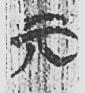亓
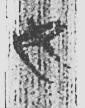女
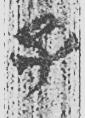子
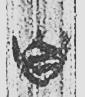自
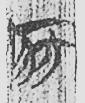房
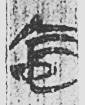{宀𠁩}
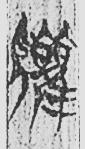觀
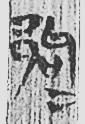邭=
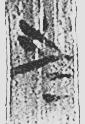之=
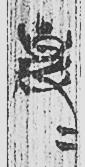尅=
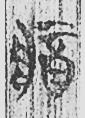𨟻
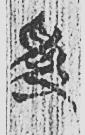受
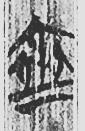齊
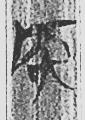侯
